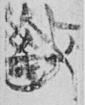○（措）
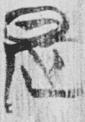是
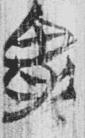{胃刀}（謂）
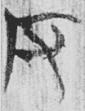反
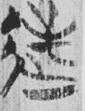逆
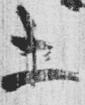土
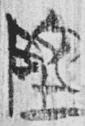地
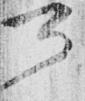乃
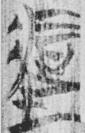○（坼）
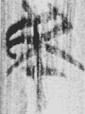民
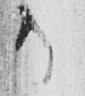人
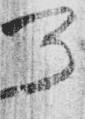乃
